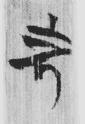先
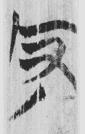反
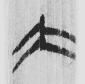大
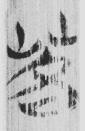茖
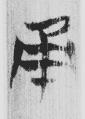甬
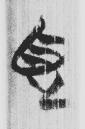見
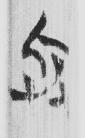兵
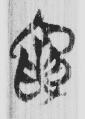龜
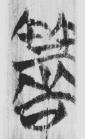{竹巫口}
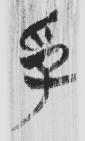孚
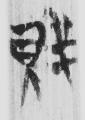貣
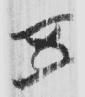五
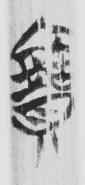寶
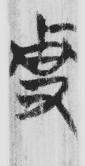覍
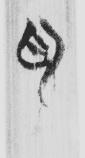色
